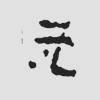甘
